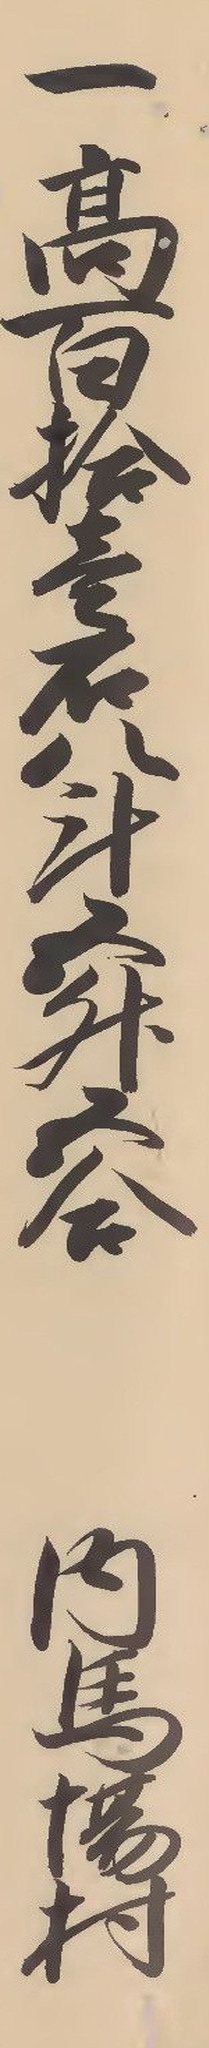一高百拾壱石八斗五升五合内馬場村
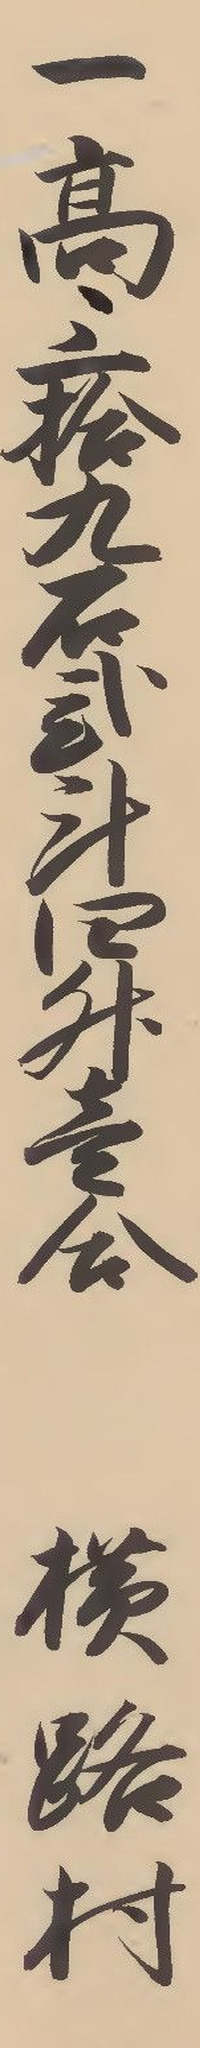一高三拾九石弐斗四升壱合横路村
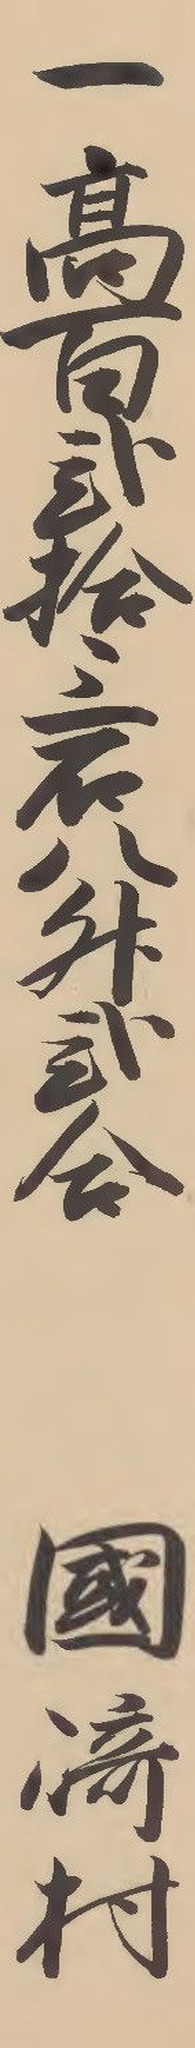一高百弐拾三石八升弐合国崎村
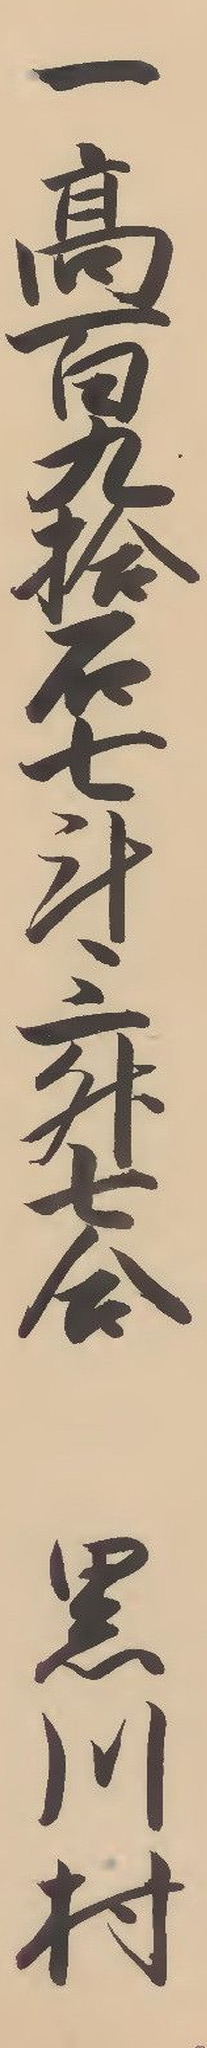一高百九拾石七斗三升七合黒川村

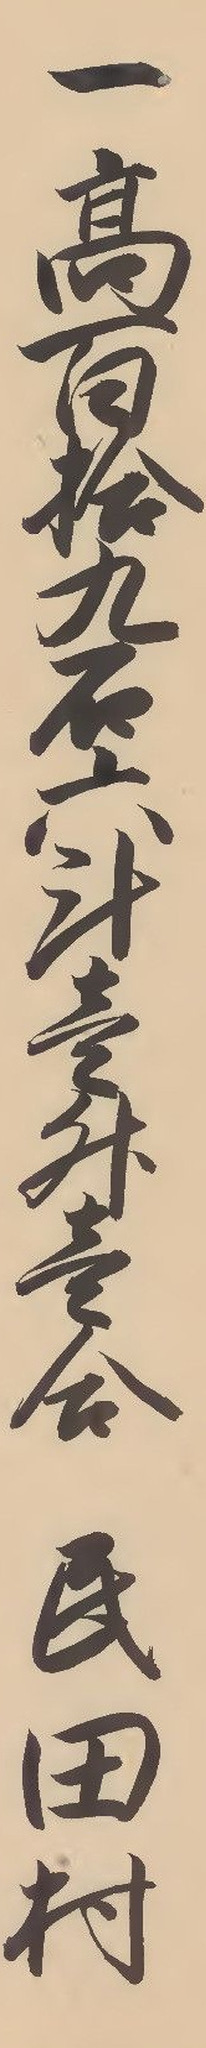一高百拾九石六斗壱升壱合民田村
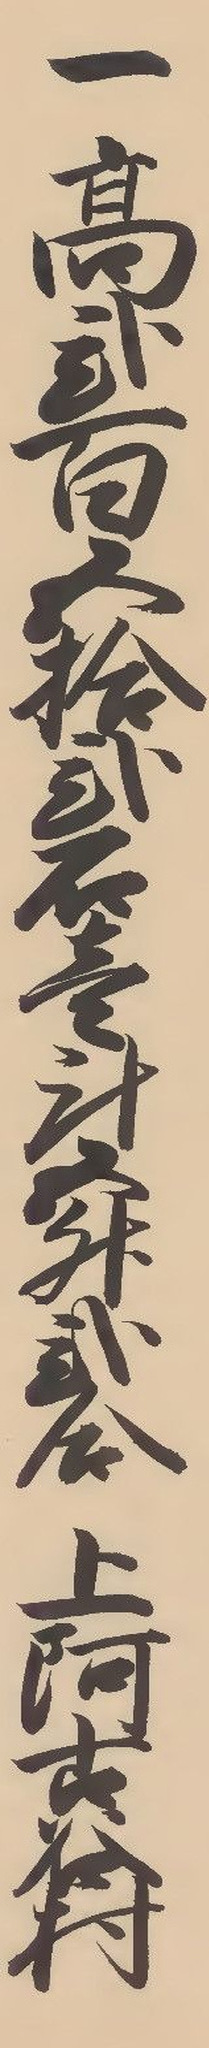一高弐百五拾弐石壱斗五升弐合上阿古谷村
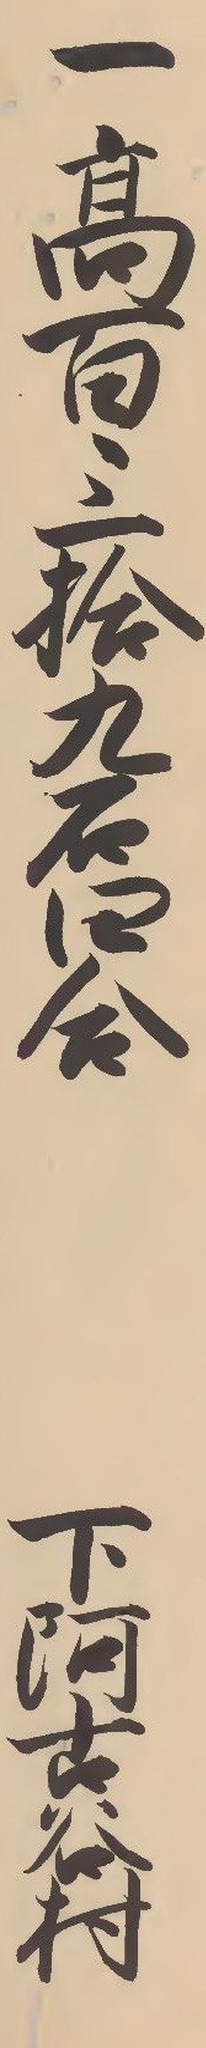一高百三拾九石四合下阿古谷村
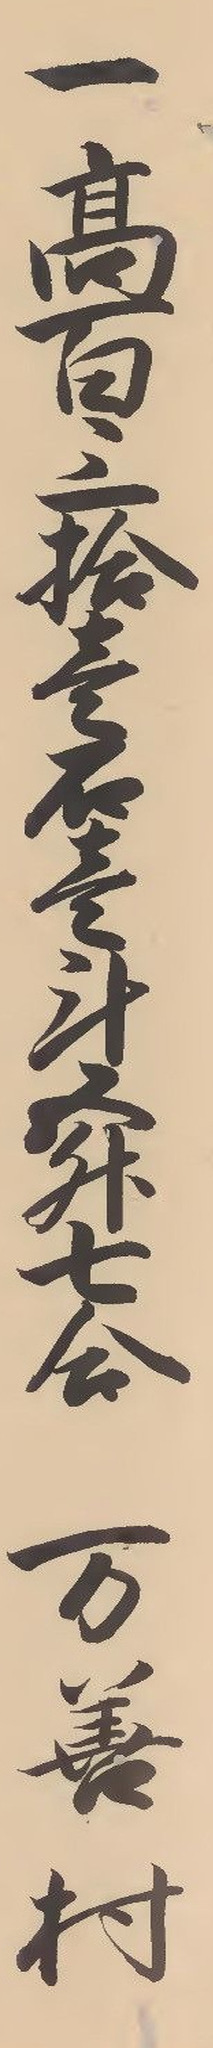一高百三拾壱石壱斗五升七合万善村
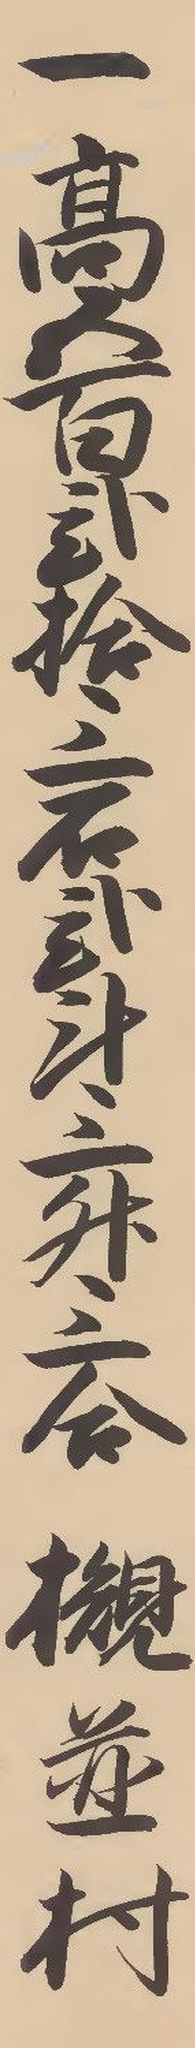一高五百弐拾三石弐斗三升三合槻並村
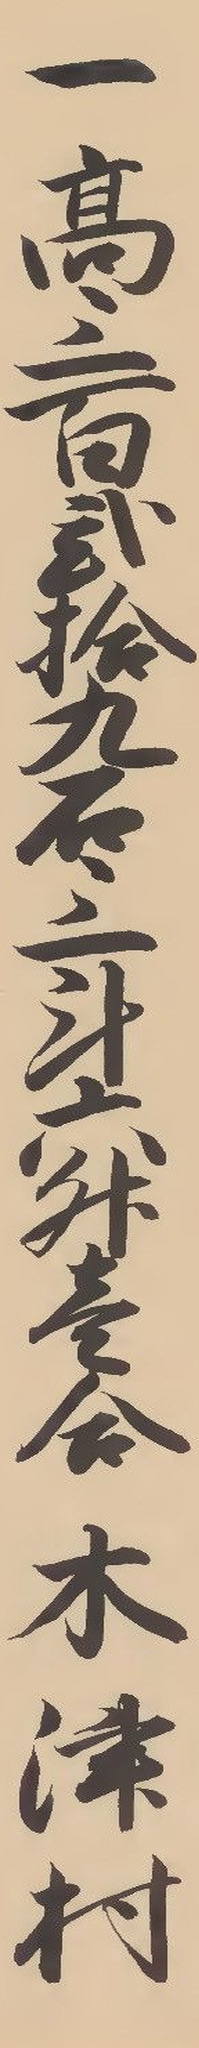一高三百弐拾九石三斗六升壱合木津村
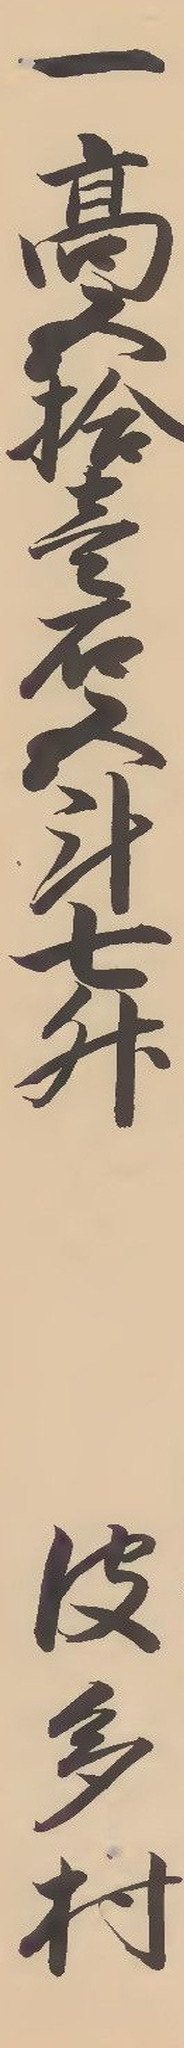一高五拾壱石五斗七升皮多村

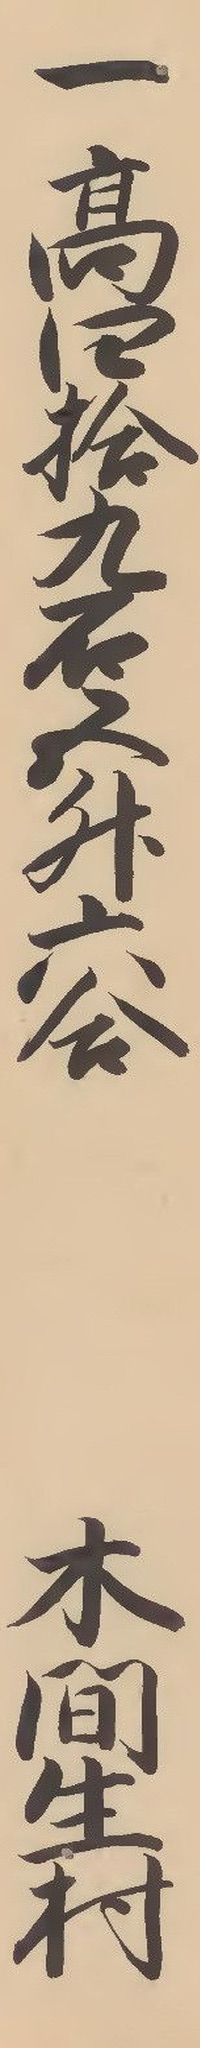一高四拾九石五升六合木間生村
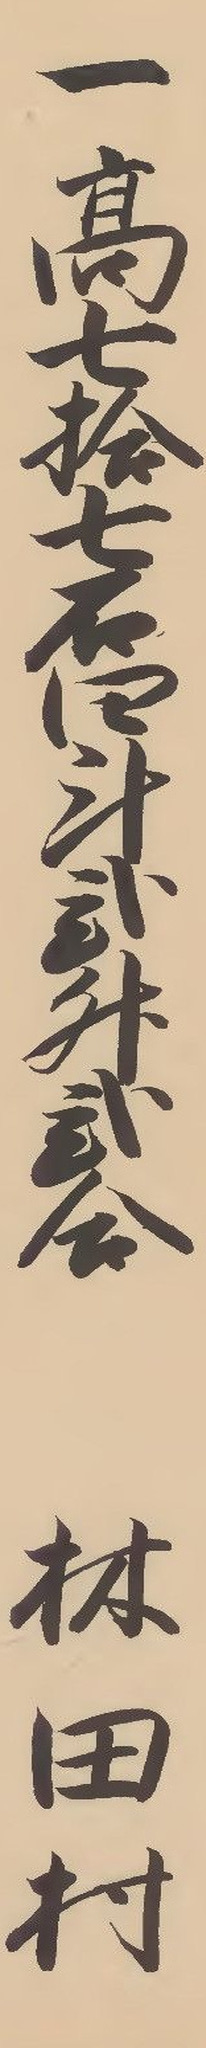一高七拾七石四斗弐升弐合林田村
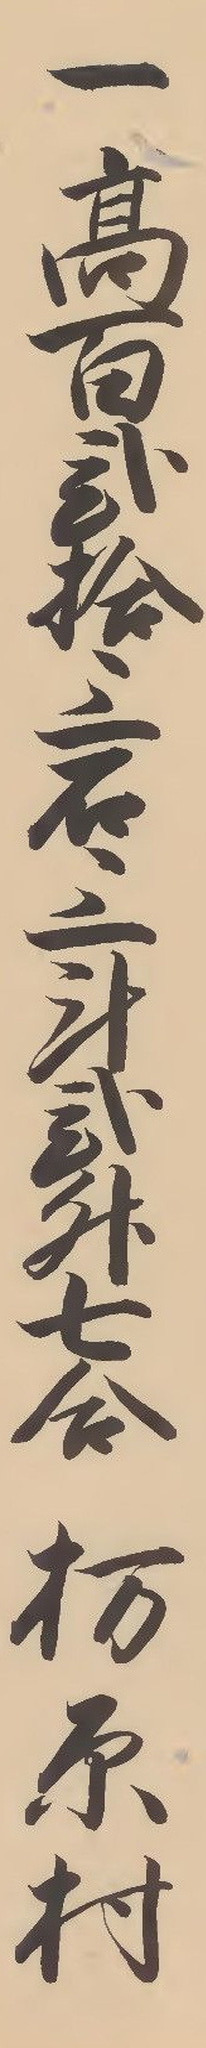一高百弐拾三石三斗弐升七合栃原村
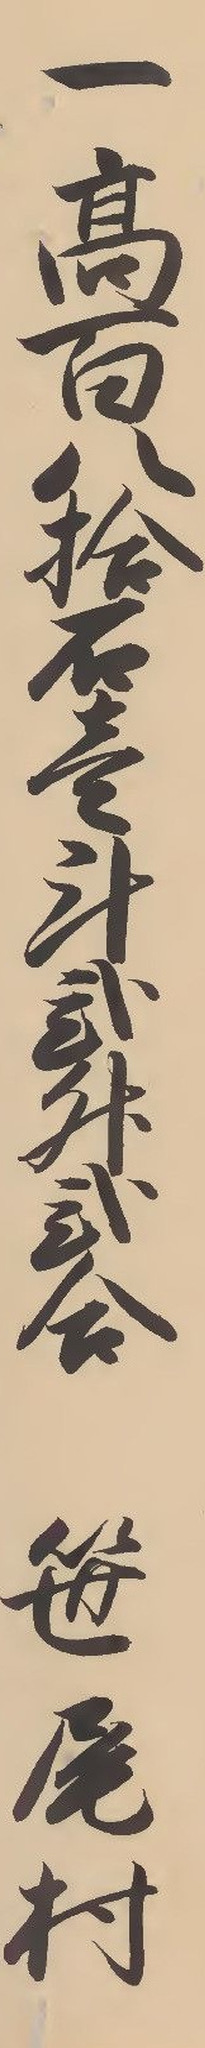一高百八拾石壱斗弐升弐合笹尾村
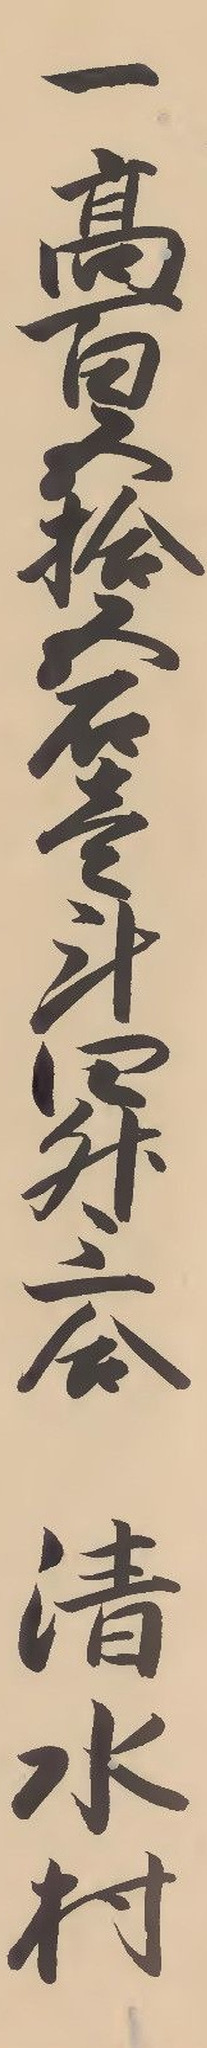一高百五拾五石壱斗四升三合清水村
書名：摂津国郷帳
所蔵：国立公文書館 National Archives of Japan
